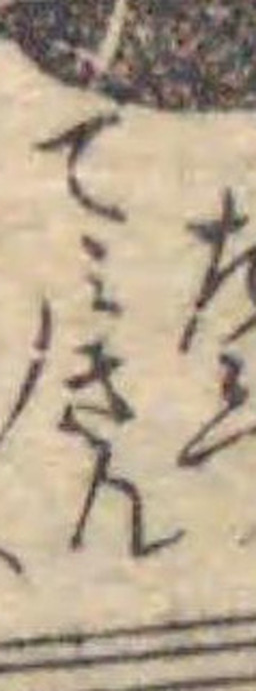てみきん
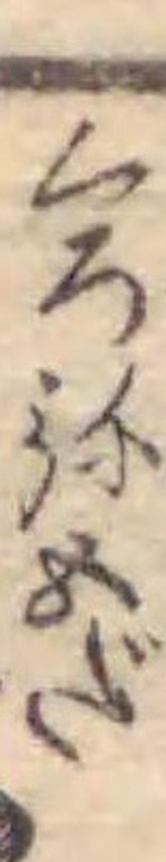くろ弥五だ
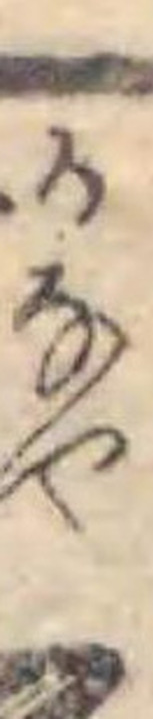かなや
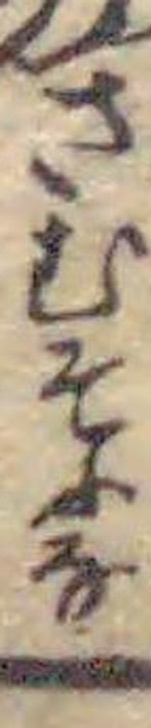さむそふな
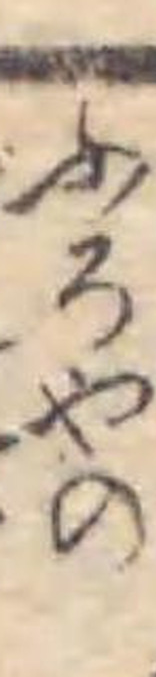ふろやの
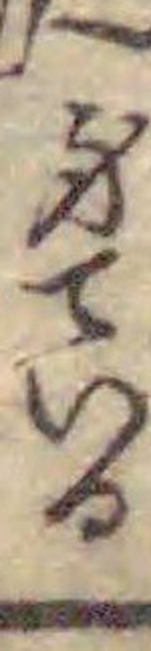身ている
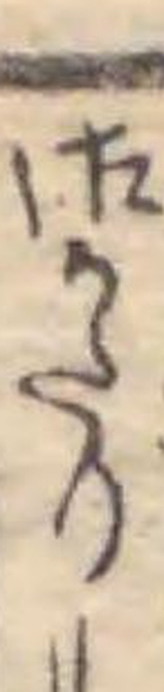御かたり
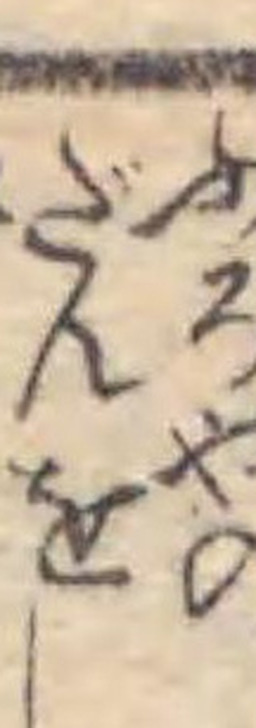だんを
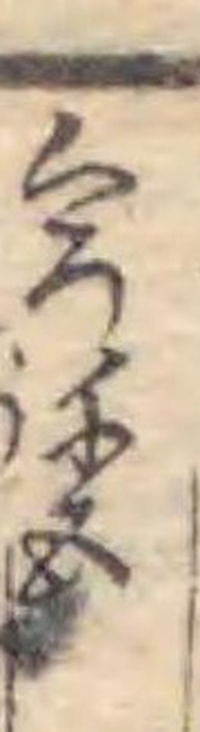くろ弥五
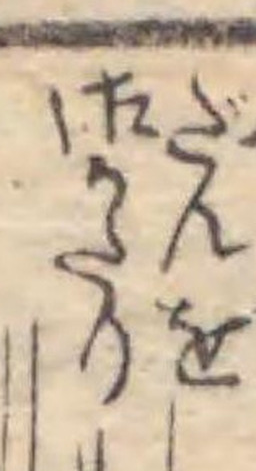御かたり
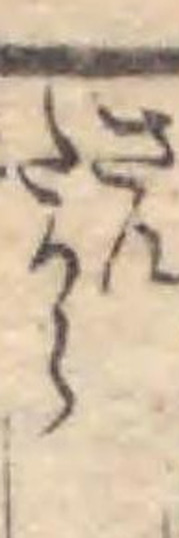たから
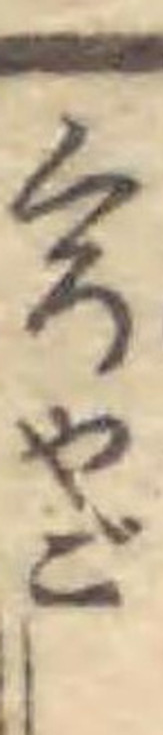くろやご
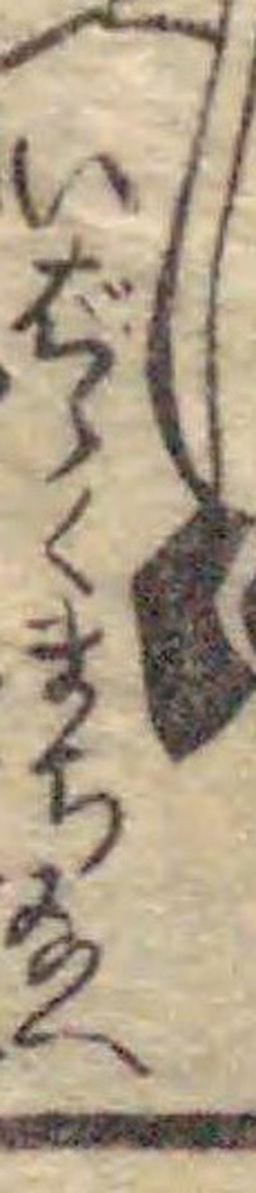いばらくまち給へ
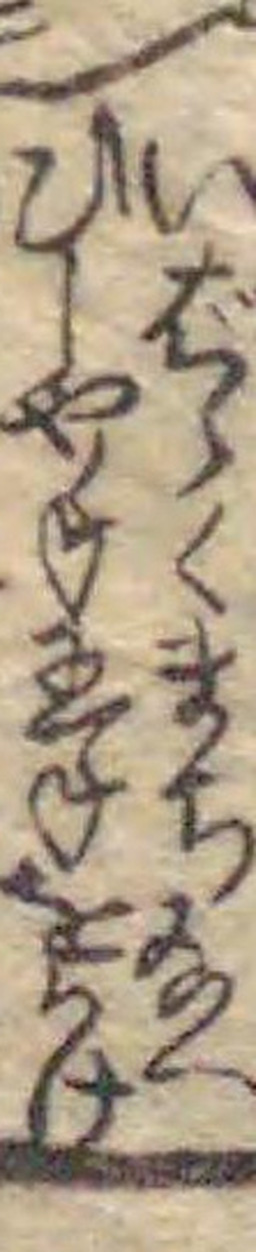ひしや手王手をかけ
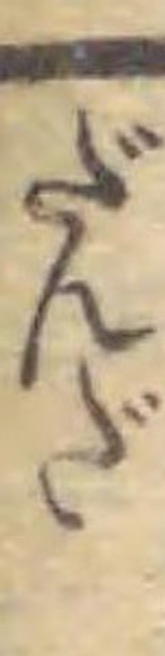だんだ
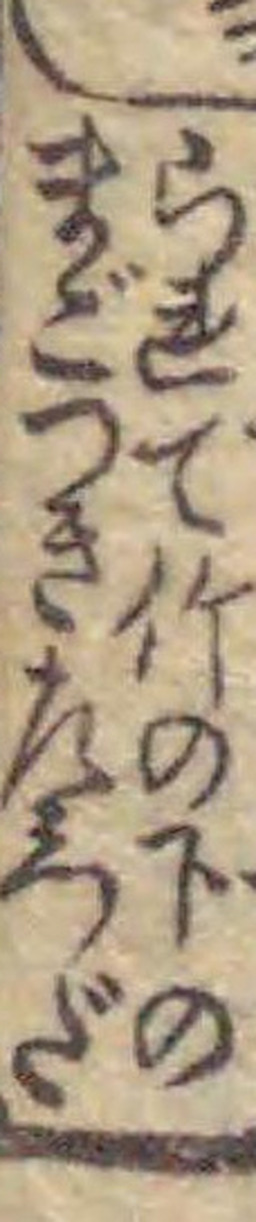まごつき左衛門だ
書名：文武二道万石通 : 3巻
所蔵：国立国会図書館 National Diet Library, JAPAN
